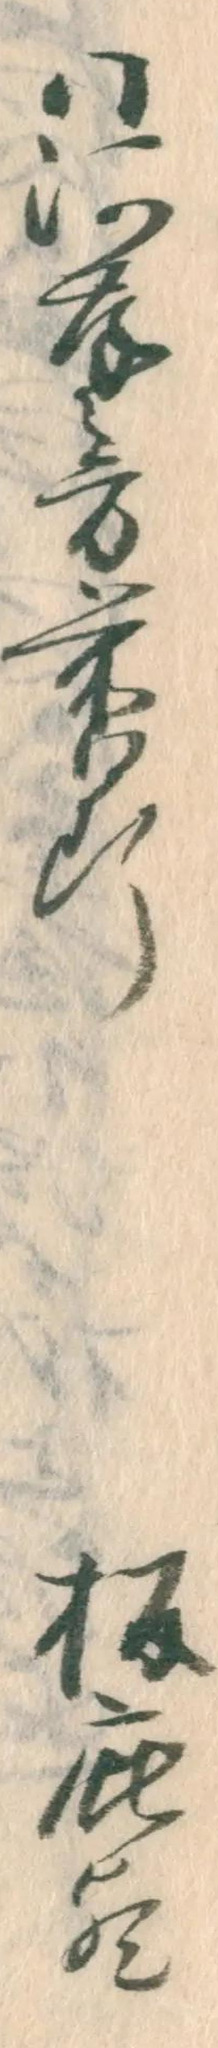同河岸之方前同断板庇歟
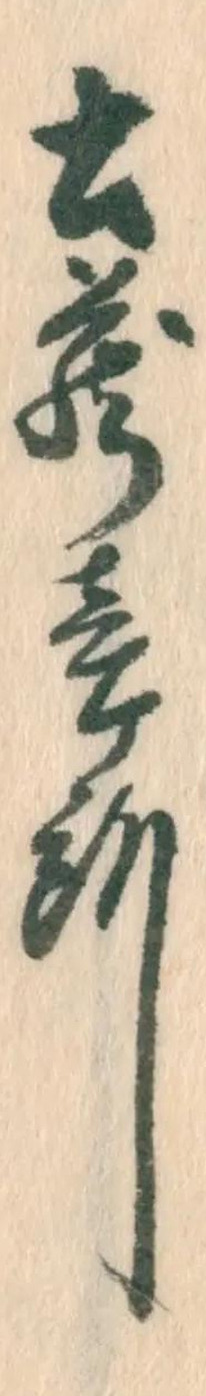土蔵壱ヶ所

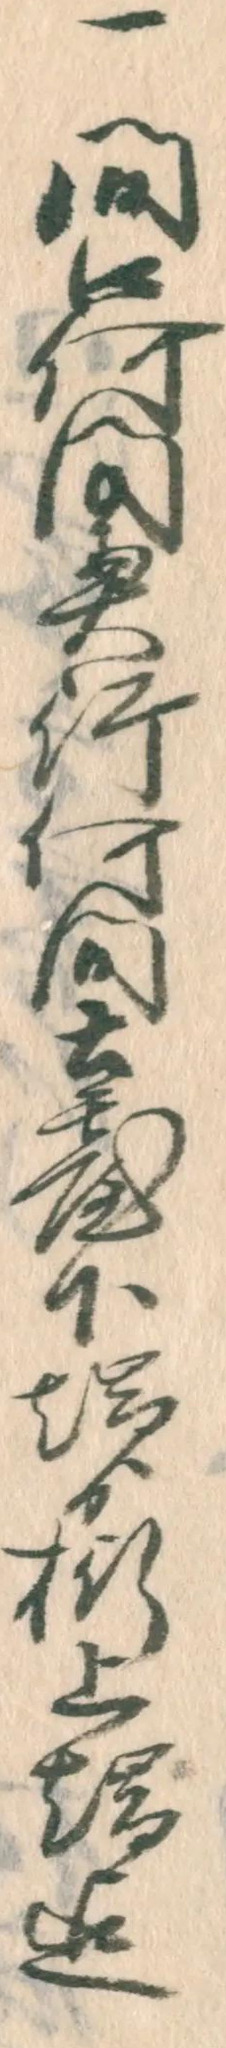一間口何間奥行何間土蔵下端ゟ桁上端迄
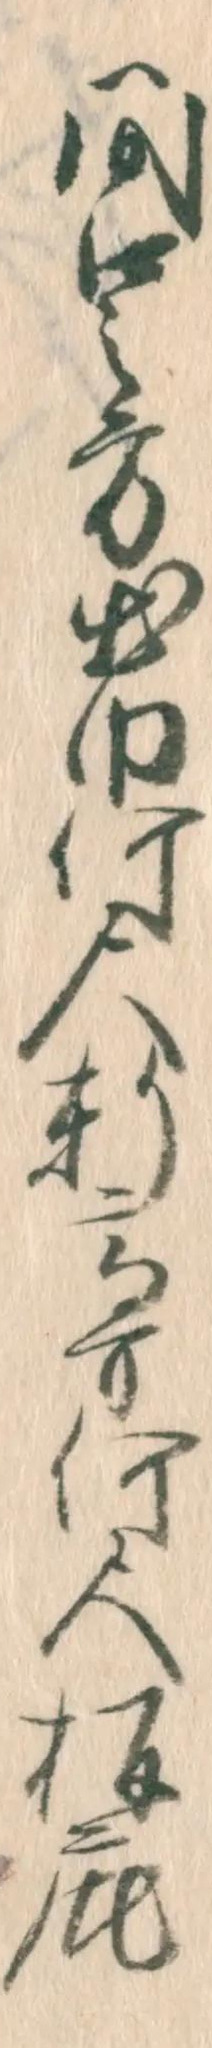間口之方出巾何尺棟高サ何尺板庇
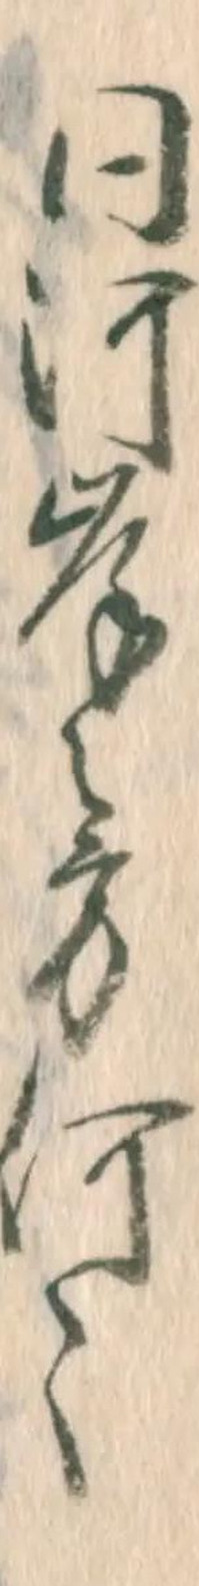同河岸之方何〻
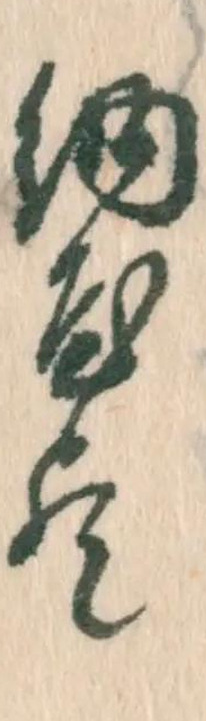納屋歟
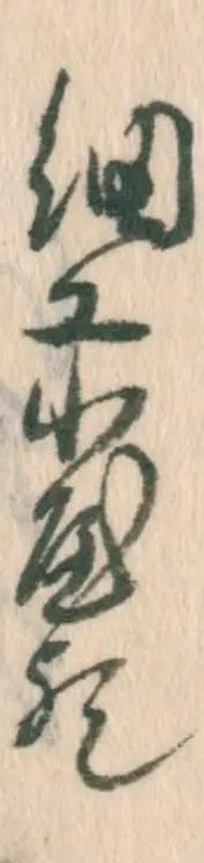細工小屋歟
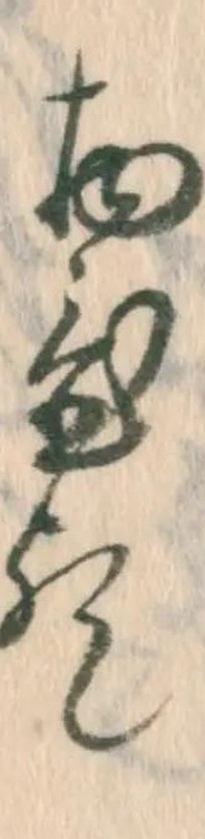物置歟
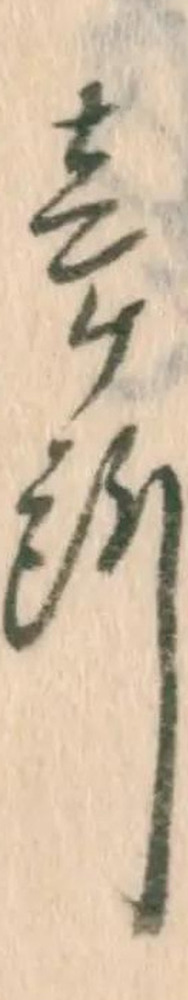壱ヶ所
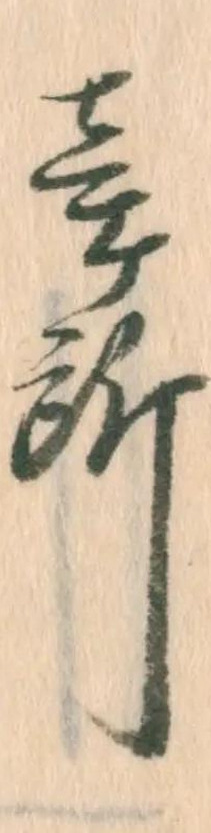壱ヶ所

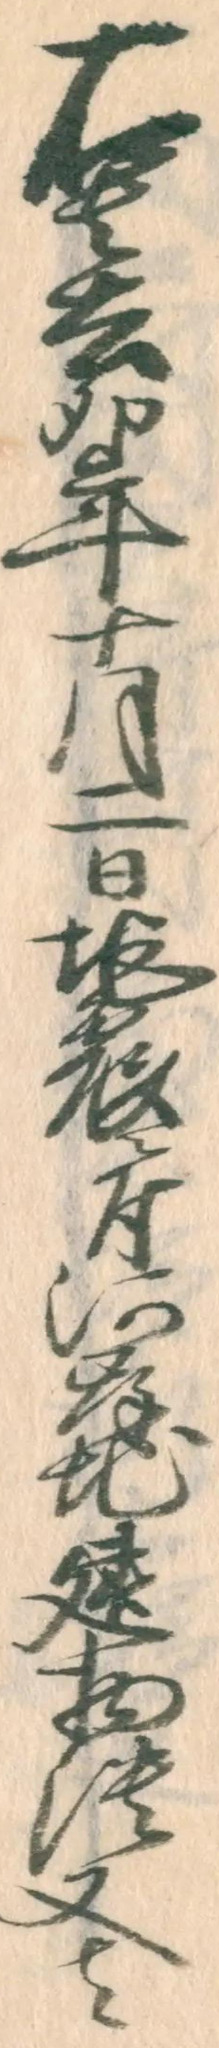右は去卯年十月二日地震ニ付河岸地建物潰又は
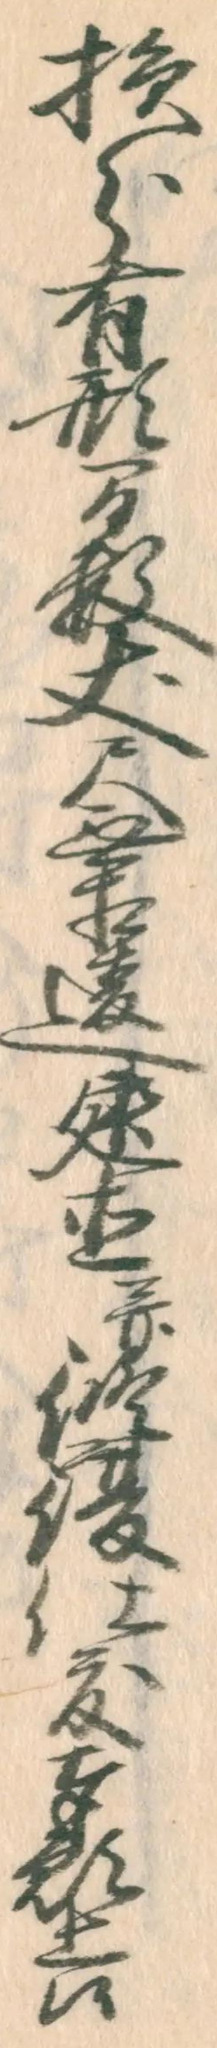損分有形間数丈尺無相違建直并修復仕度奉願上候
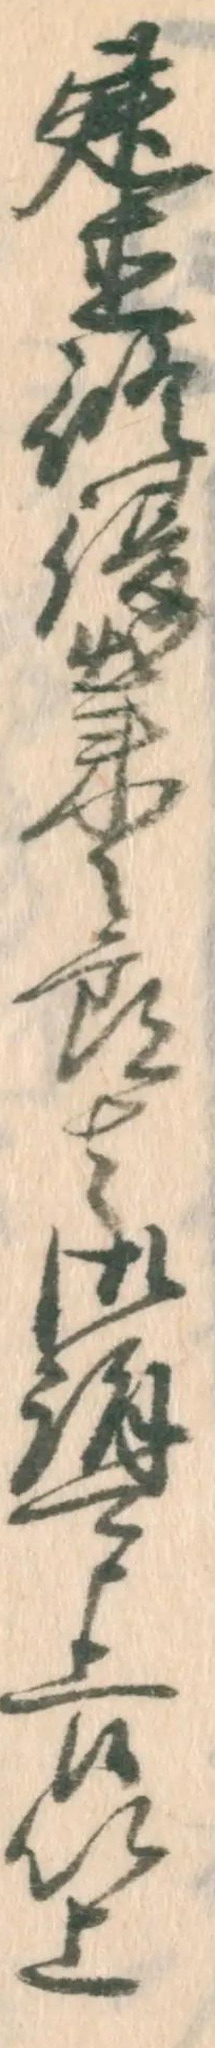建直修復出来之節は御訴可申上候以上
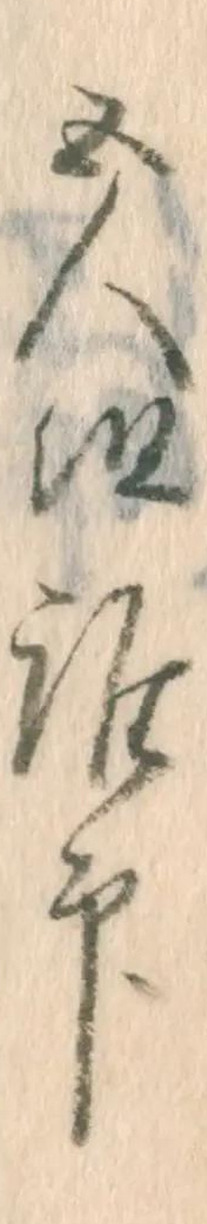五人組誰印
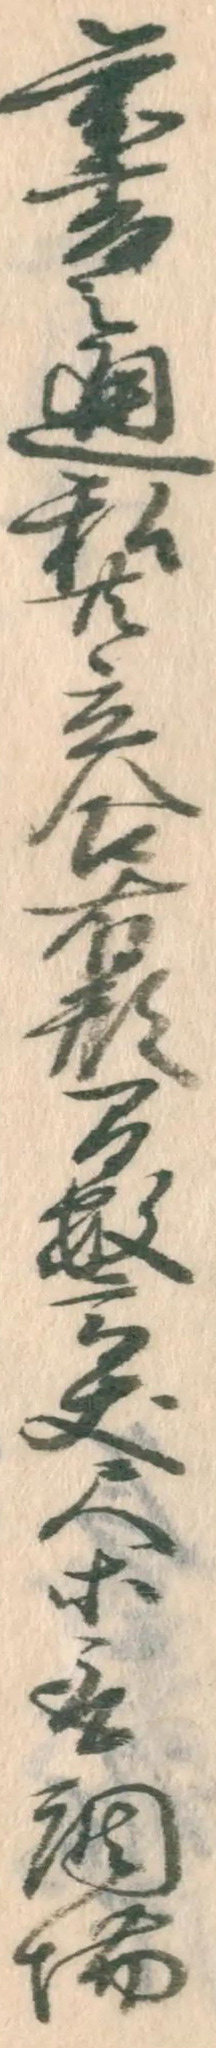前書之通私共立合有形間数高丈尺等取調場
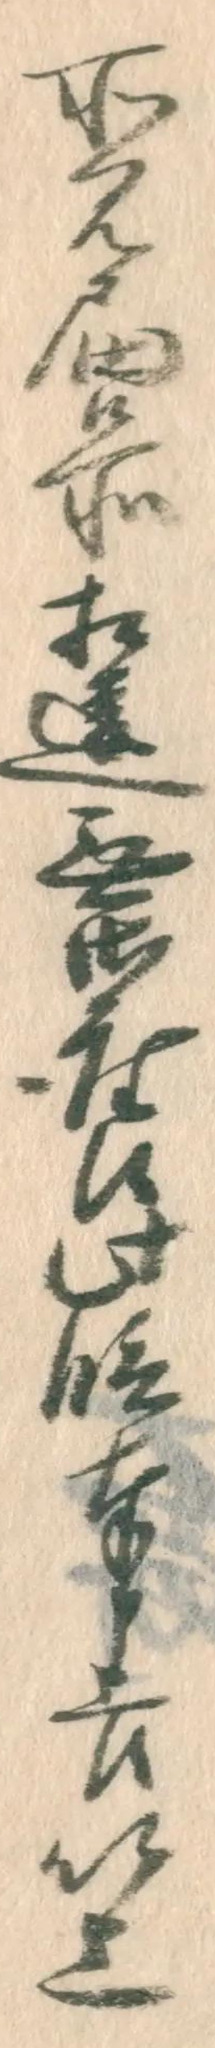所見届候処相違無御座候此段奉申上候以上
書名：地震災書留 2巻. [1] 内表紙に「地震災書留　安政二卯年　但本所深川御用屋敷地代免除調」とあり
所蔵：国立国会図書館 National Diet Library, JAPAN
